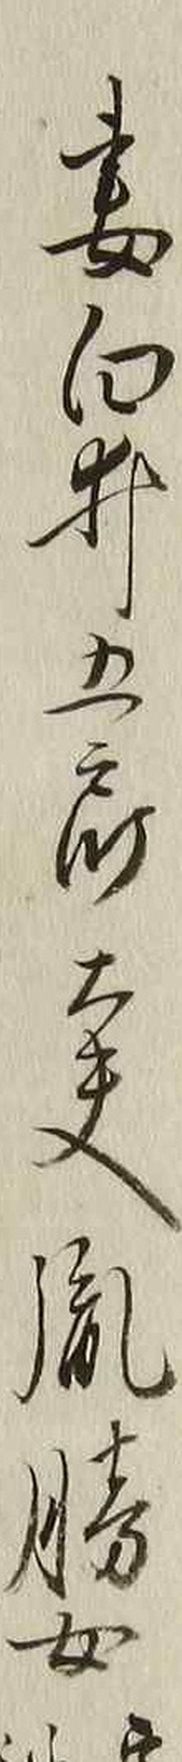妻白井五郎大夫胤勝女
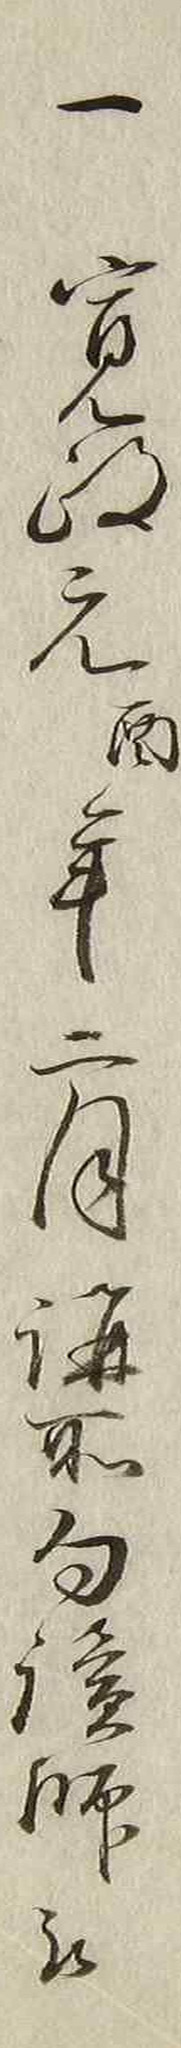一寛政元酉年二月講所句読師
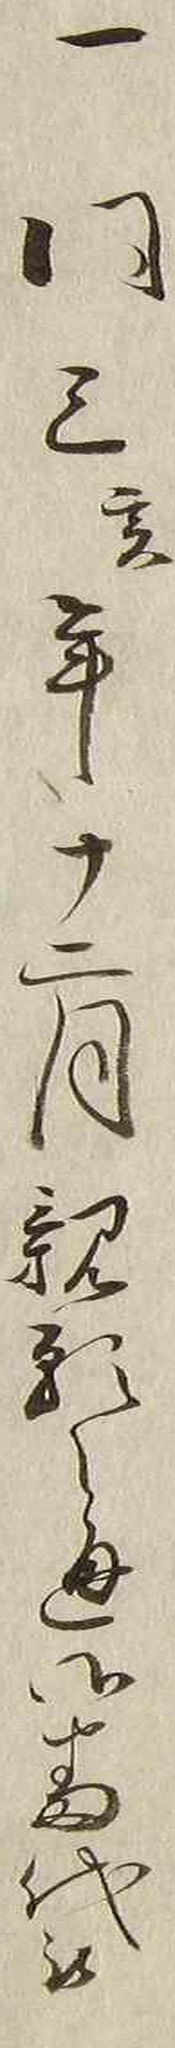一同三亥年十二月親願い之通り御番代

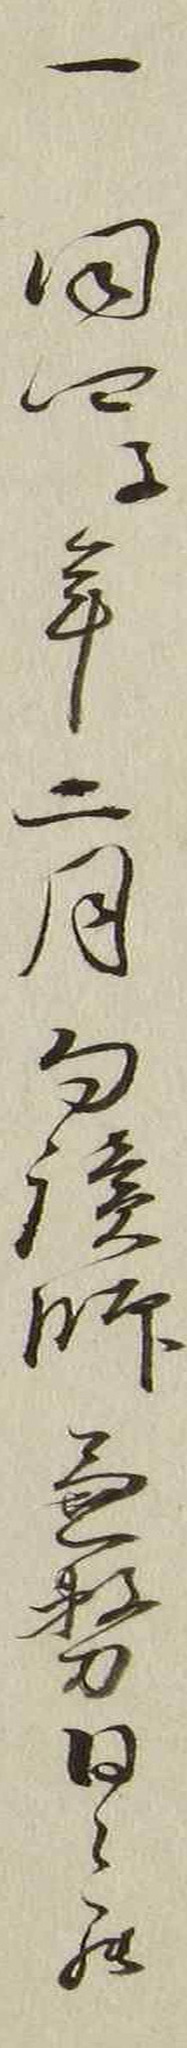一同四子年二月句読師兼務日々罷り
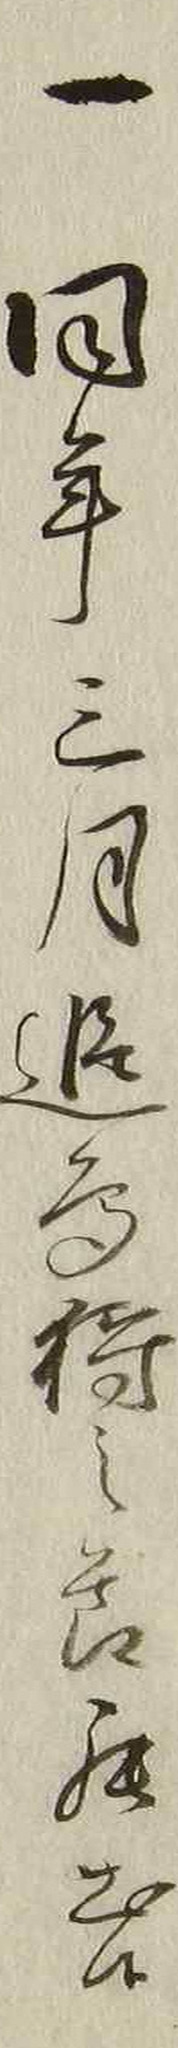一同三月追鳥狩之節罷り出で候
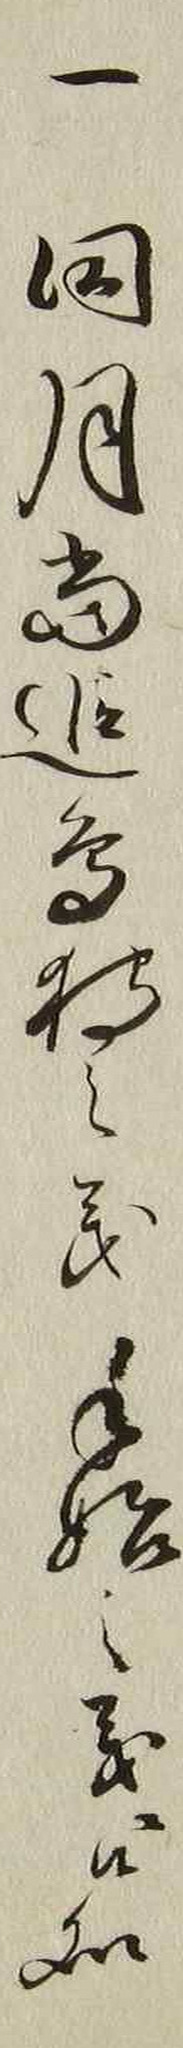一同月当追鳥狩之義手始め之義ニ候処
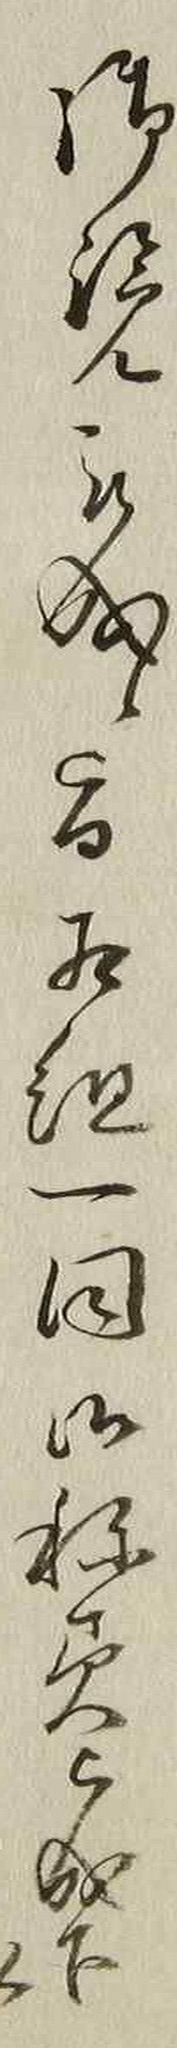御覧成られ候旨相組一同御称美成し下され候
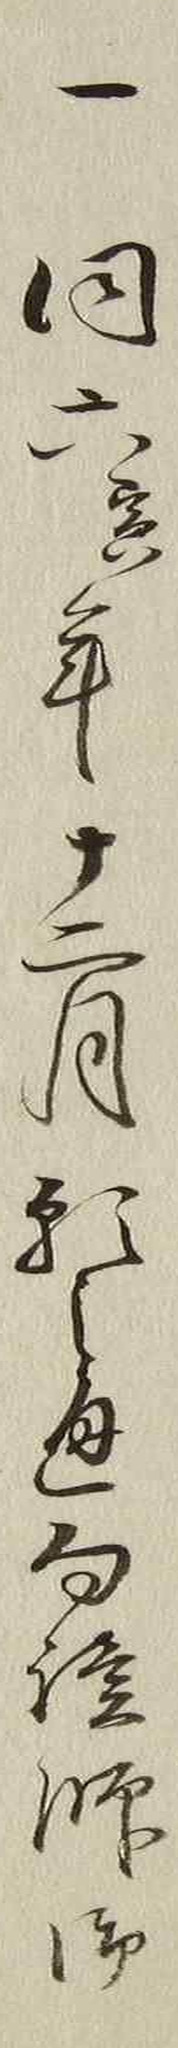一同六寅年十二月願い之通句読師御
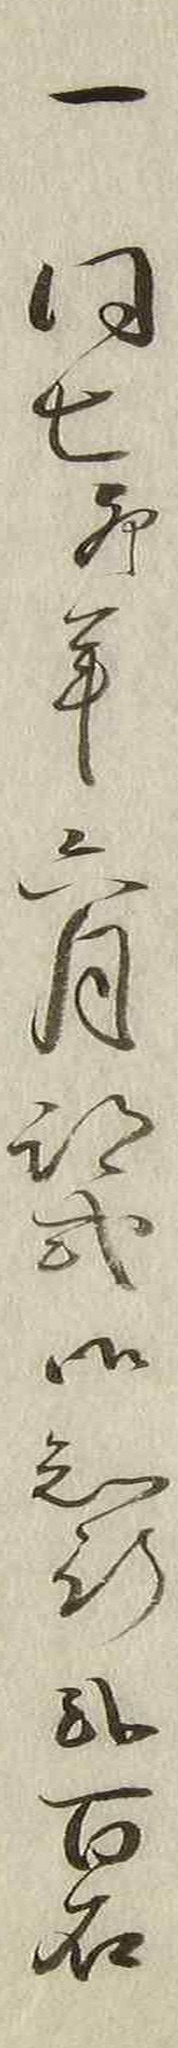一同七卯年六月跡式御知行弐百石
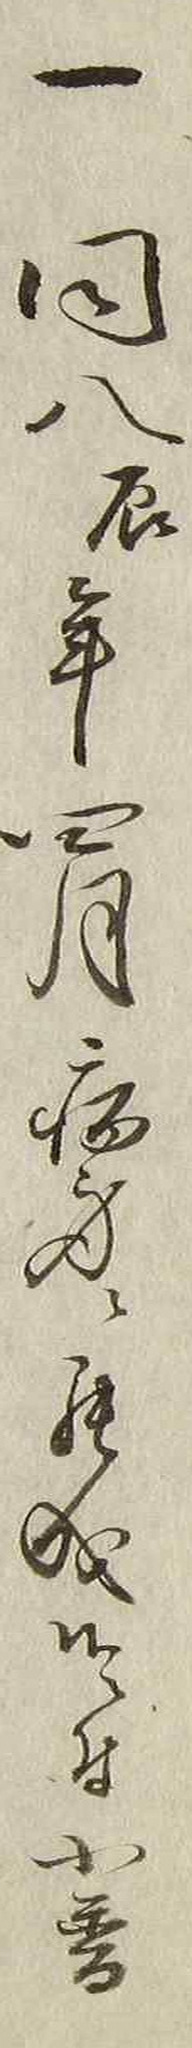一同八辰年四月病身ニ罷り成り候ニ付き小普
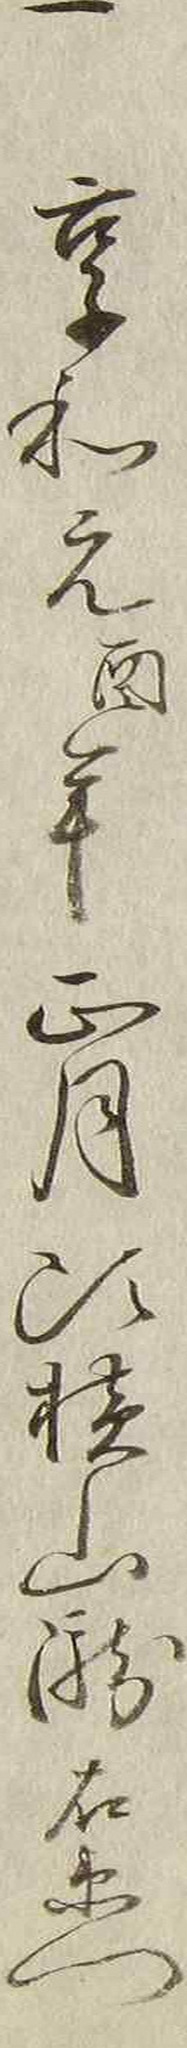一享和元酉年正月頃横山瀧右衛門
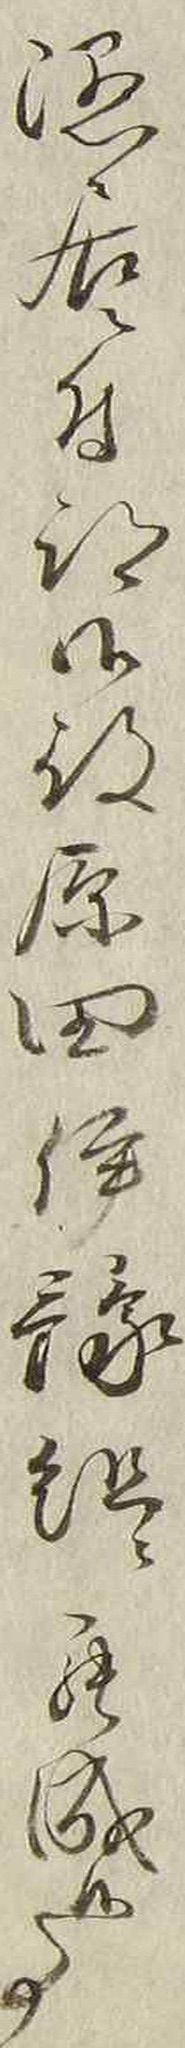隠居ニ付き跡御役原田伊豫組ニ罷り成り候事

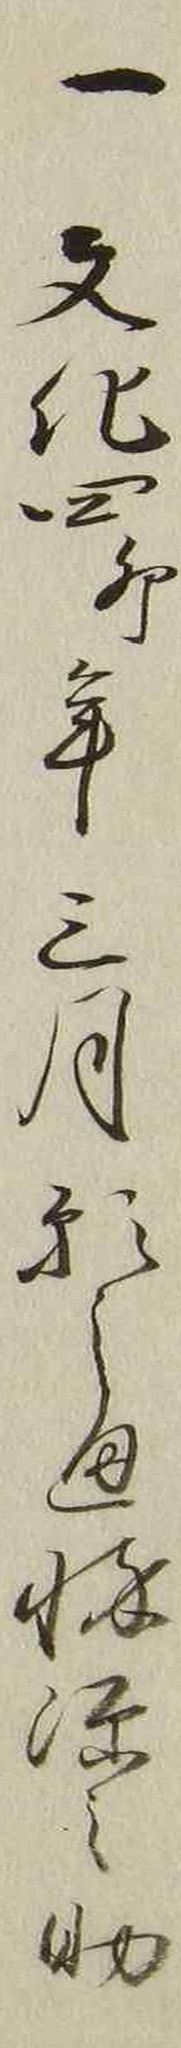一文化四卯年三月願い之通り倅源之助
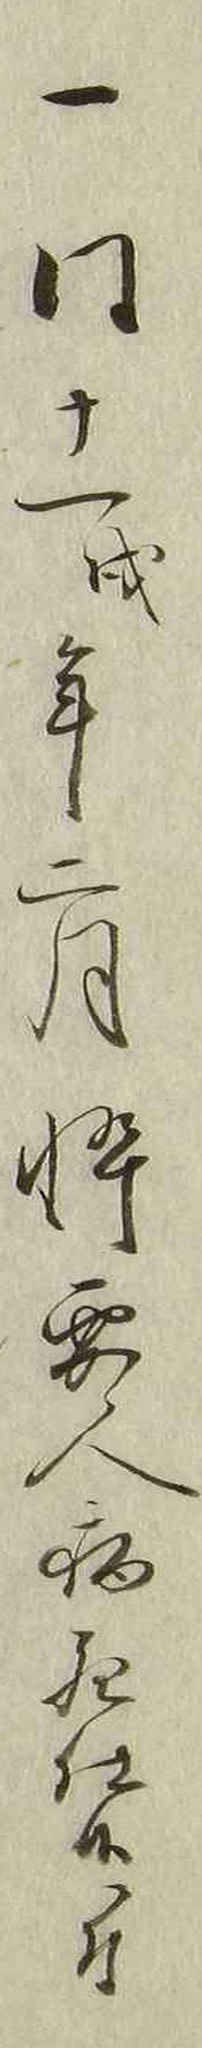一同十一戌年二月倅要人病死仕り候ニ付き
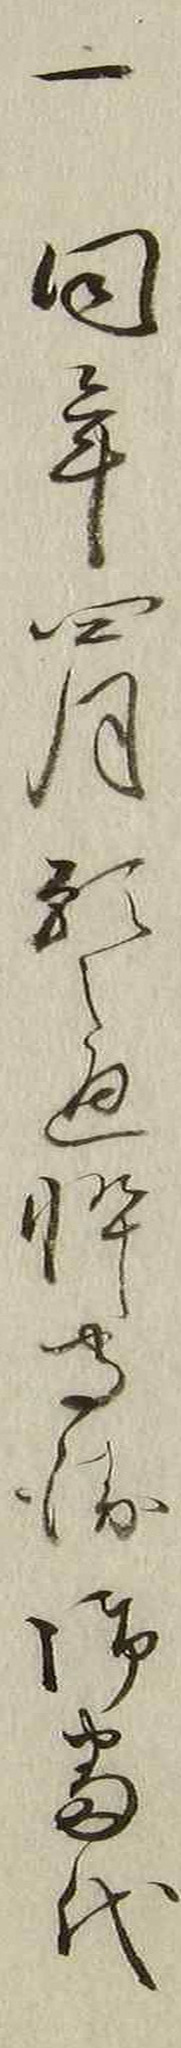一同年四月願い之通り倅守勝御番代
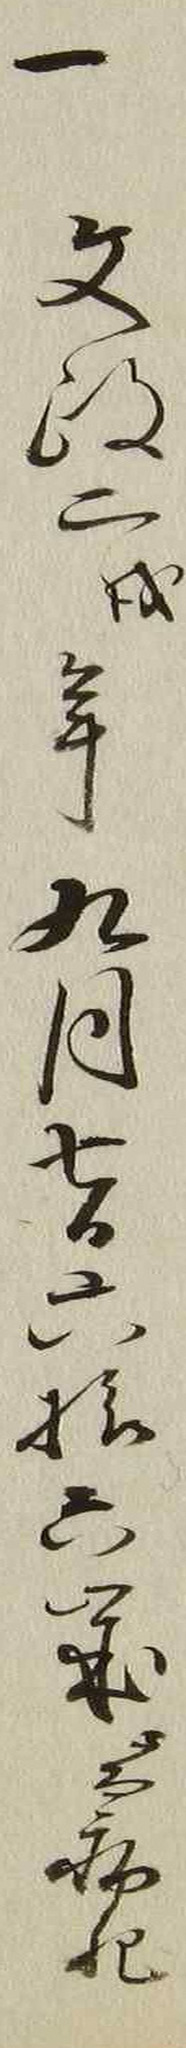一文政二戌年九月七日六拾六歳ニて病死
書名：諸士系譜　巻之20　い之部20
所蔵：会津若松市立会津図書館
